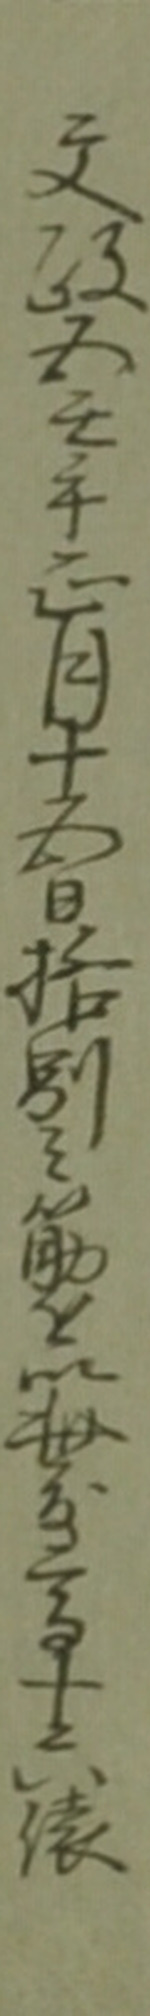一文政五壬午正月十五日格別之筋を以此度高十六俵

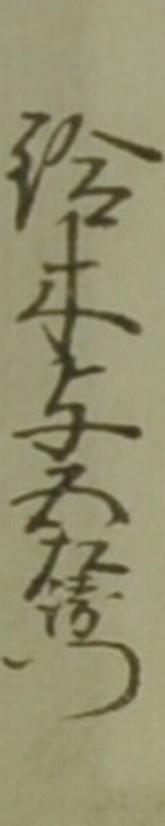鈴木与五左衛門

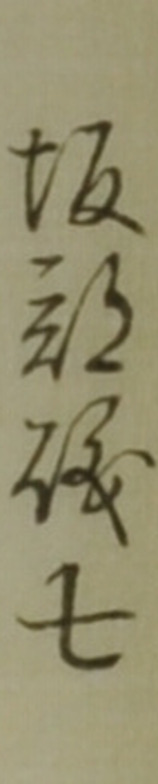坂部磯七

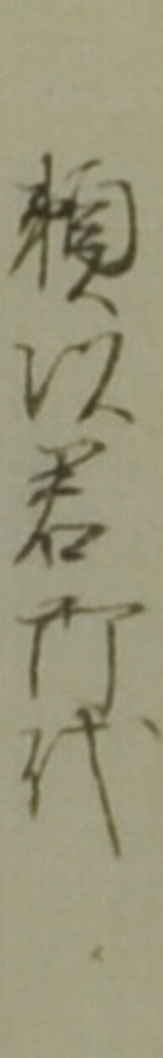頼以君御代
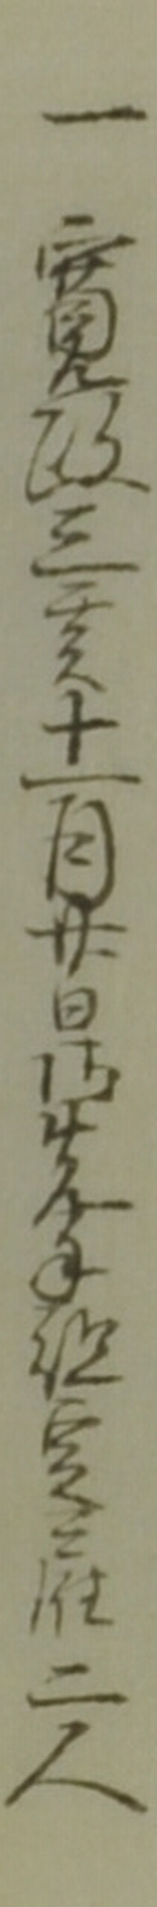一寛政三亥十一月廿日御先手組定雇二人
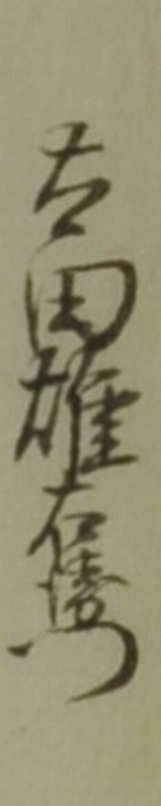古田雄右衛門
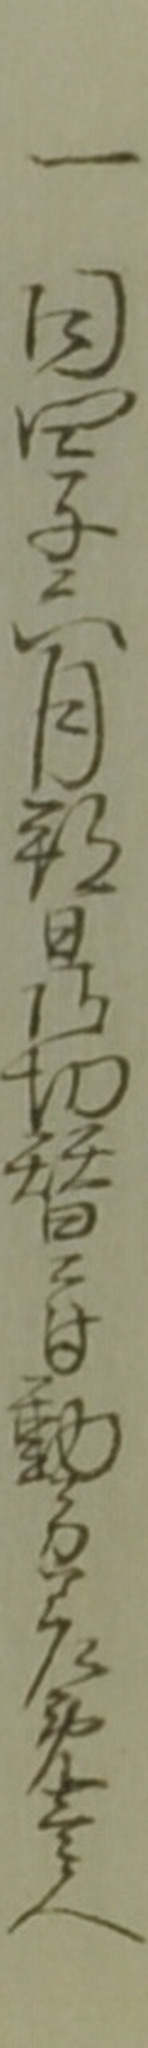一同四子六月朔日御切替ニ付勤方差免壱人
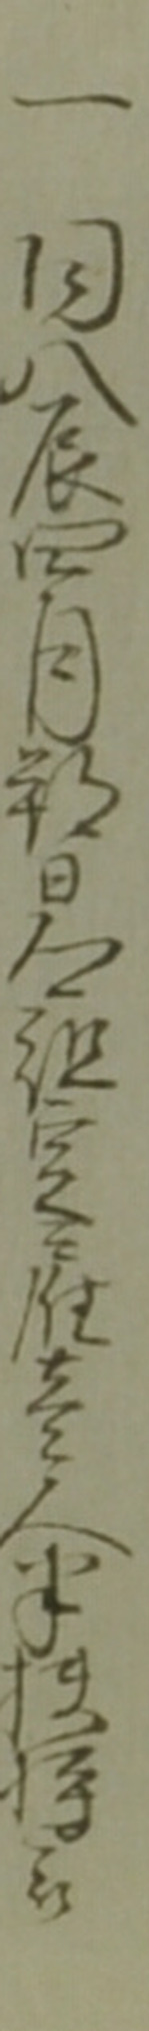一同八辰四月朔日郷組定雇壱人半扶持被
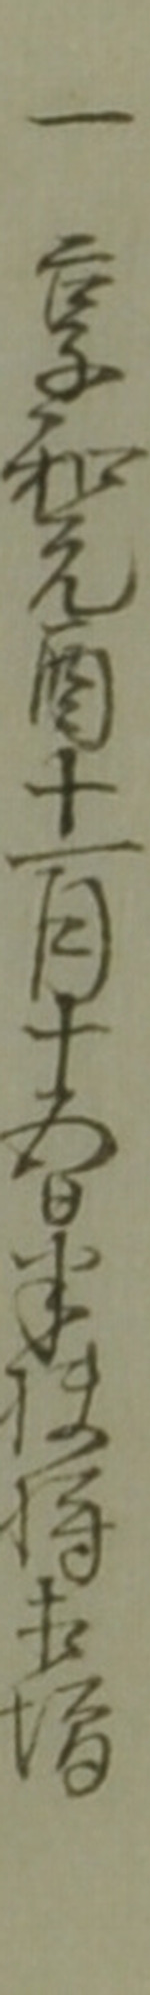一享和元酉十一月十五日半扶持相増
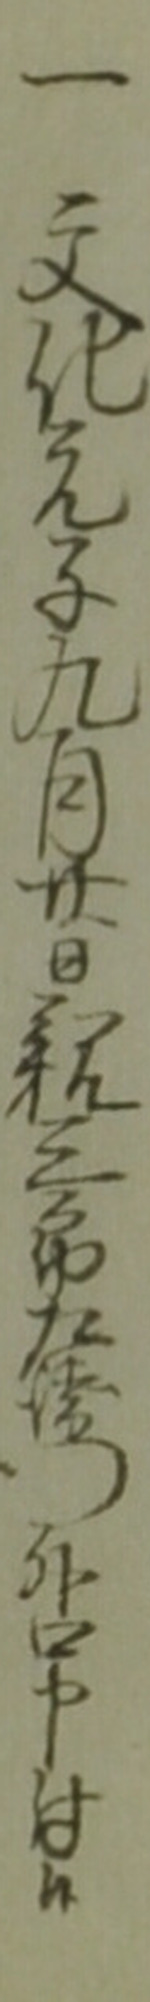一文化元子九月廿日親三郎左衛門咎申付候
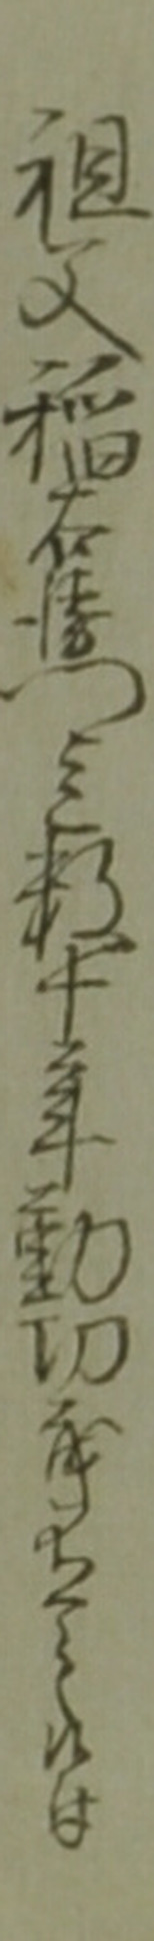祖父稲右衛門迄数十年勤切茂有之候付
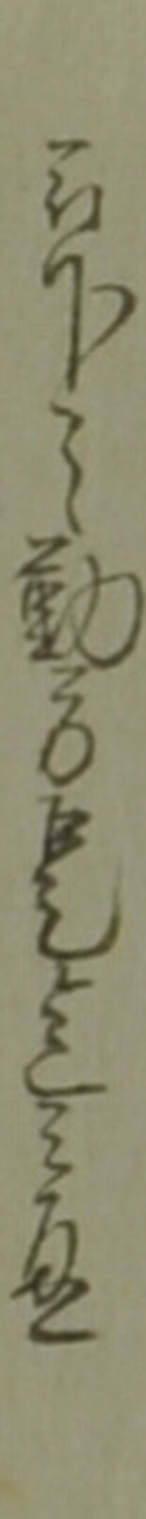被下之勤方是迄之通
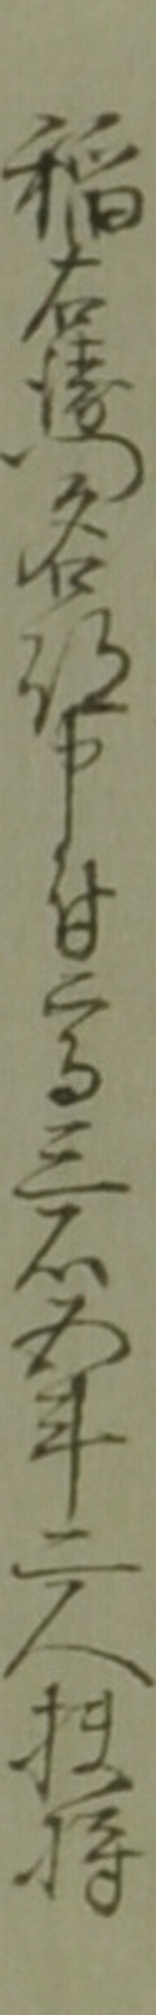稲右衛門名跡申付高三石五斗二人扶持
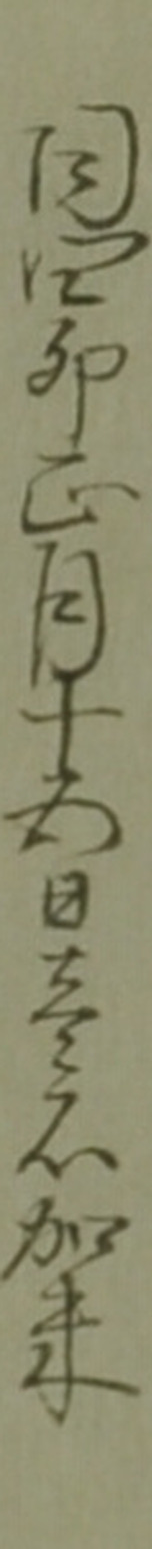一同四卯正月十五日壱石加米
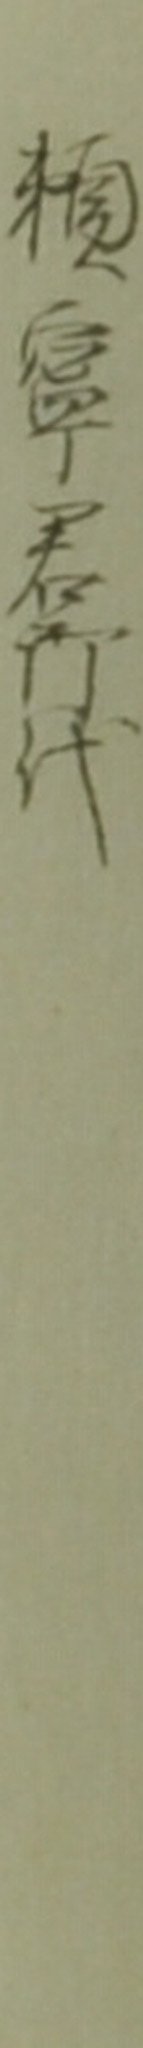頼寧君御代
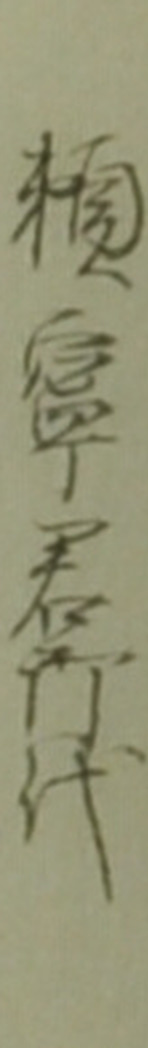頼寧君御代
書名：無足諸士勤仕録（九）
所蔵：伊那市立高遠町図書館・合同会社AMANE
